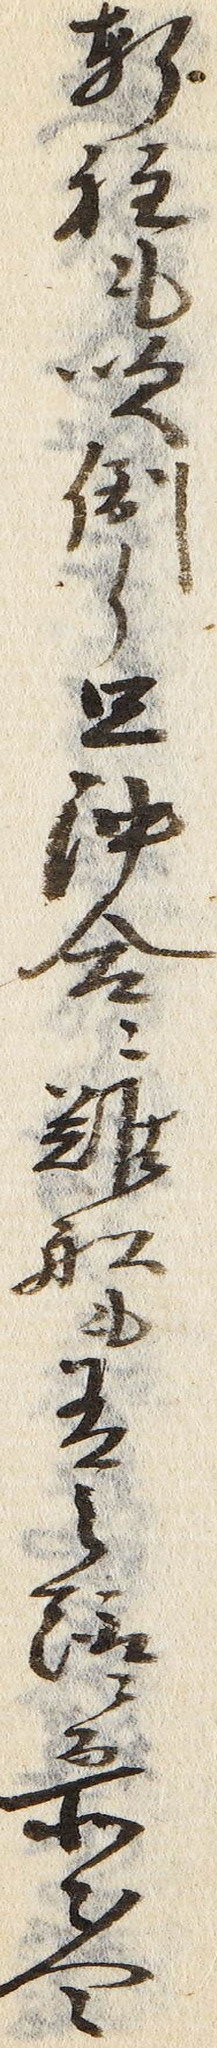軒程も吹倒し且沖合ニ難舩も有之趣ニ而所々人々
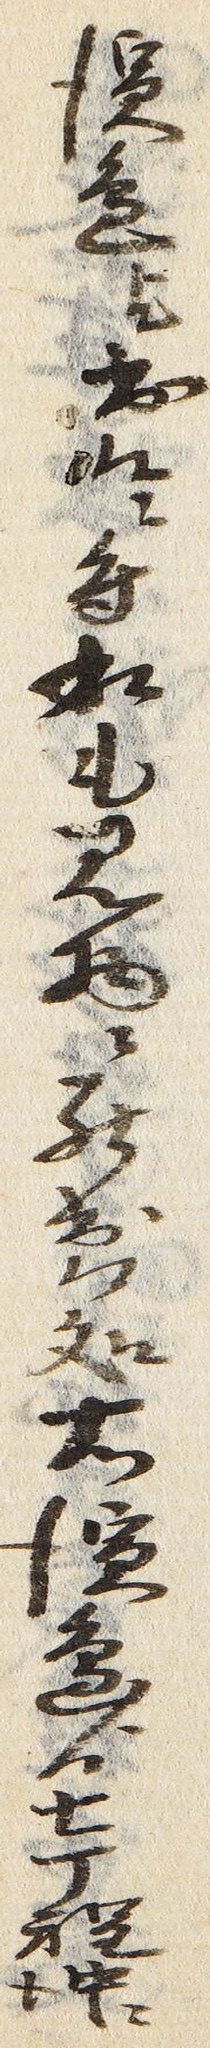濱邊江出候ニ付私も見物ニ罷出候処右濱邊ゟ七丁程沖ニ
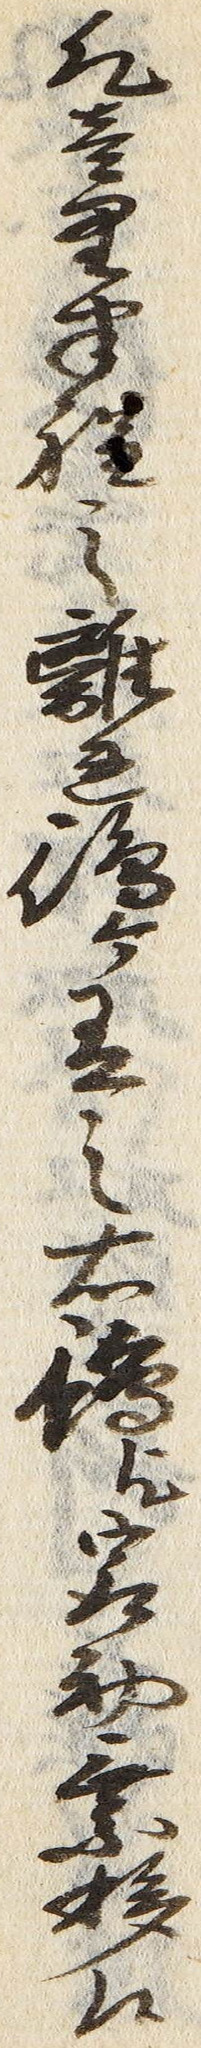凡壱里半程之離れ嶋ケ有之右嶋江最初乗移候
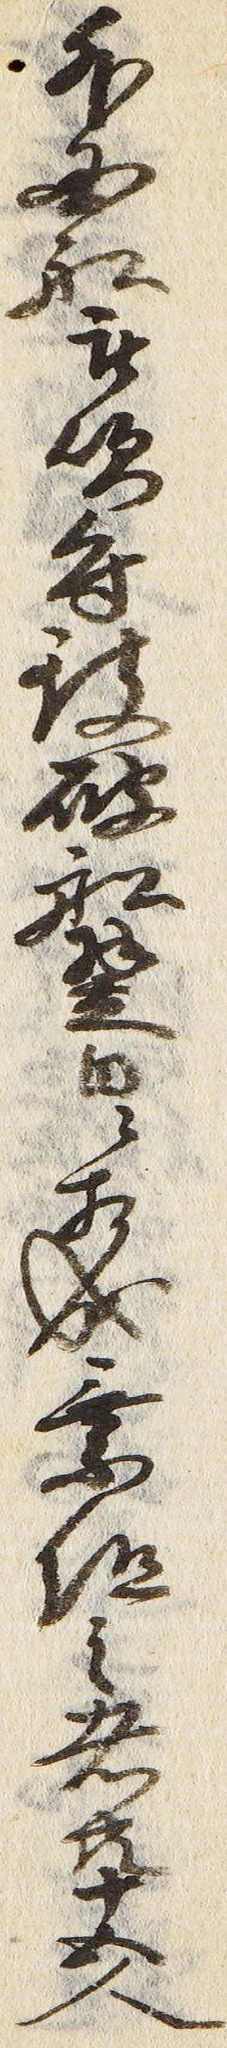外国舩被吹付致破舩翌日ニ相成乗組之者共十五人
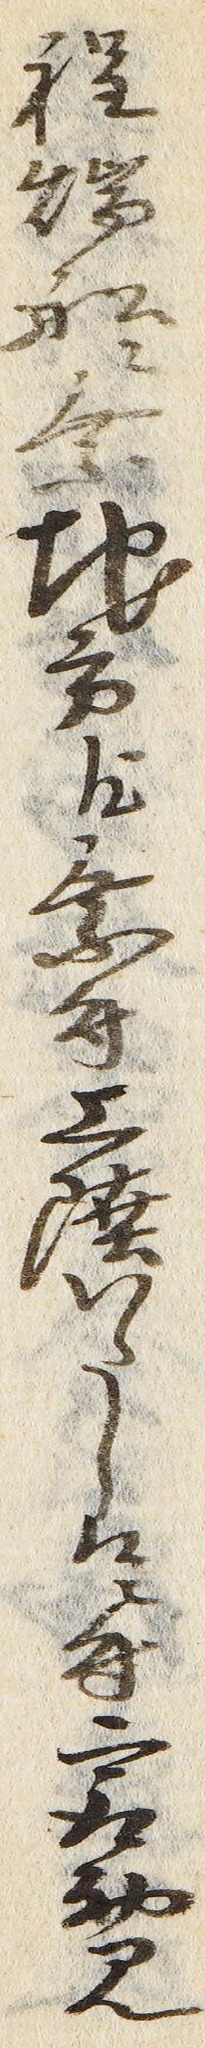程端舩ニ乗地方江乗付上陸いたし候ニ付最初見
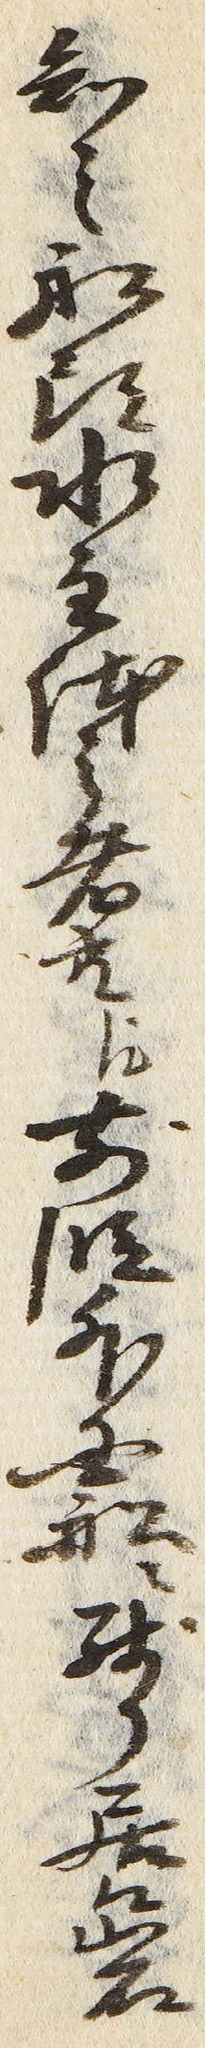知之舩頭水主体之者共江前段外国舩ニ残り居候岩
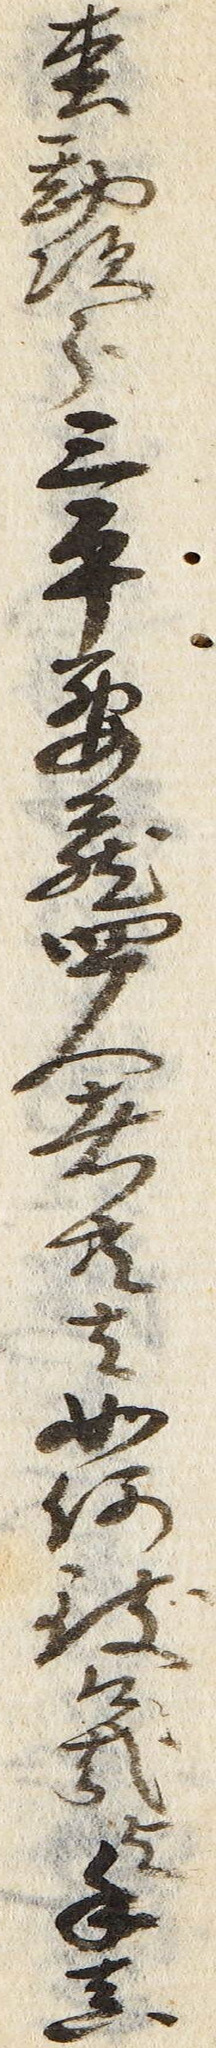枩勘次郎三平要蔵四人者共者如何致候哉と手真
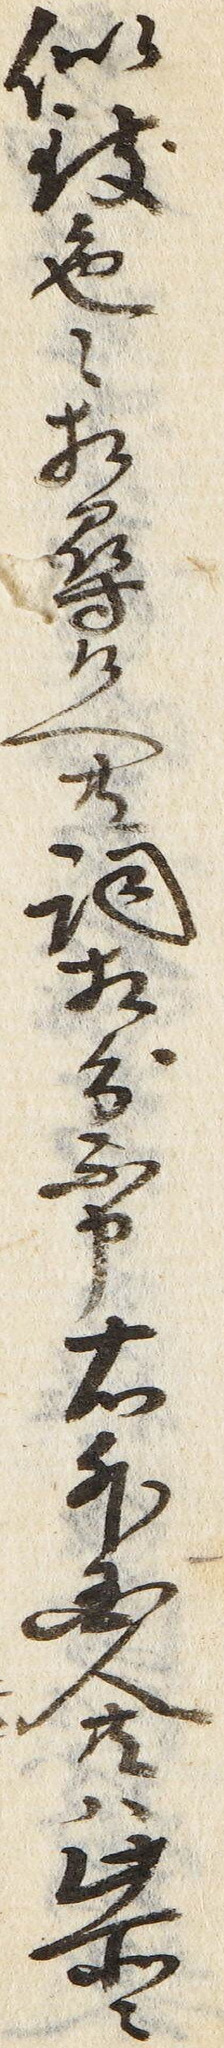似致色々相尋候へ共詞相分不申右外国人共ハ此所ニ
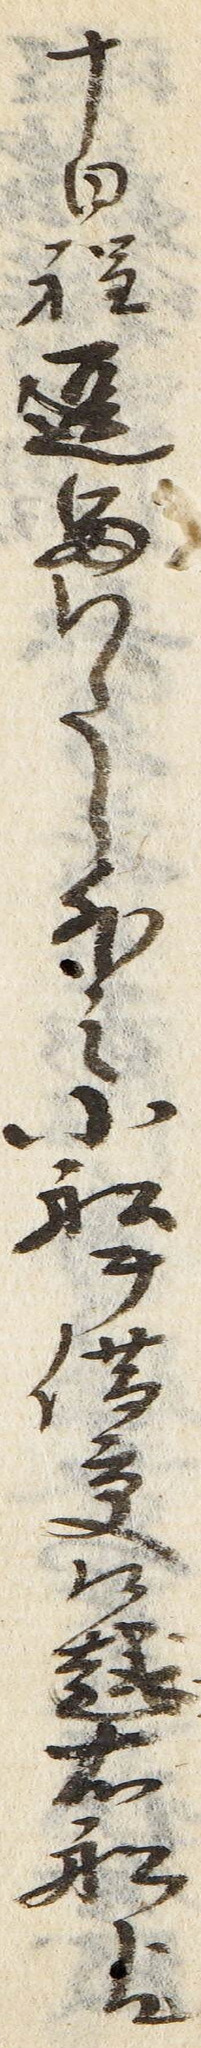十日程逗留いたし外之小舩ヲ借受候趣右舩江
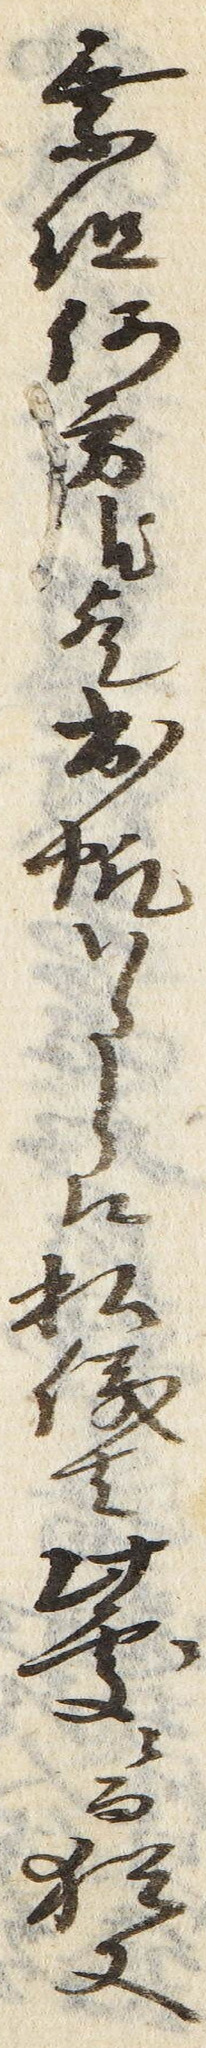乗組何方江欤出帆いたし候私儀者此處ニ而猶又

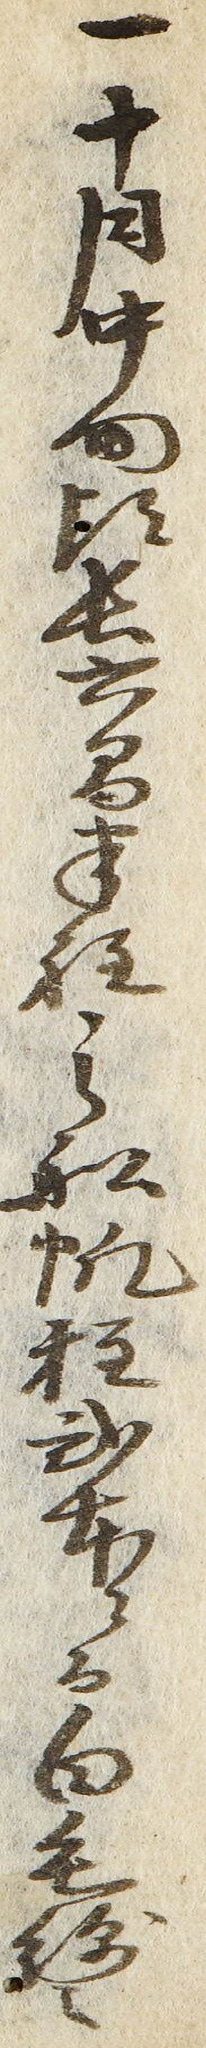一十月中旬頃長六間半程之舩帆柱弐本ニ而白毛綿之
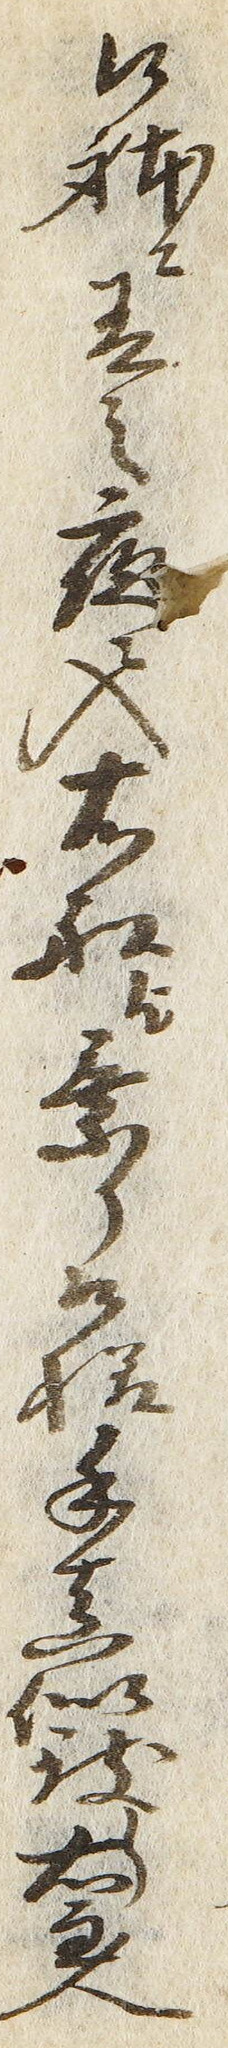候躰ニ有之夜ニ入右舩江参り候様手真似致し右主人
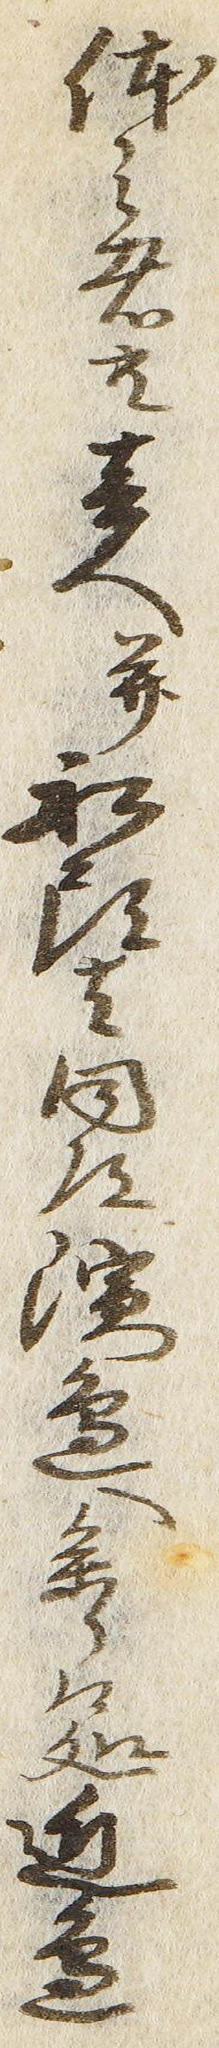体之者共壱人幷舩頭者同道濱邊へ参り候処近邊
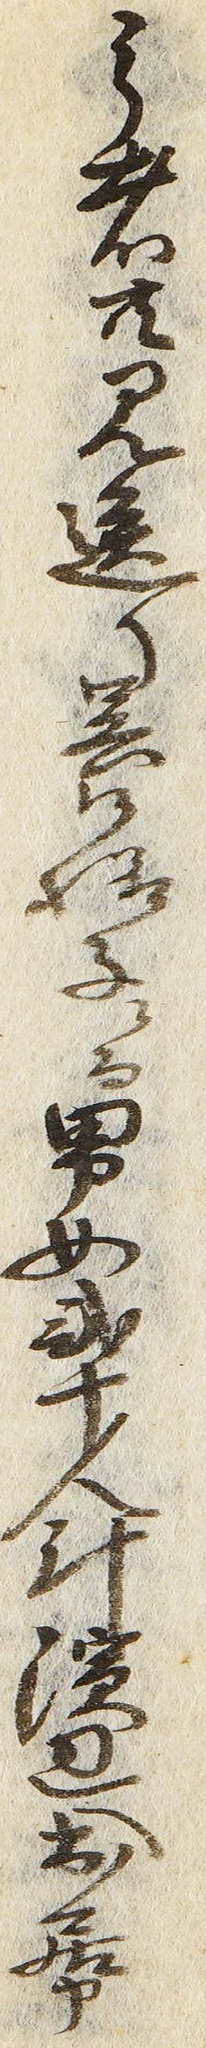之者共見送り呉候様子ニ而男女弐十人計濱辺へ出居申
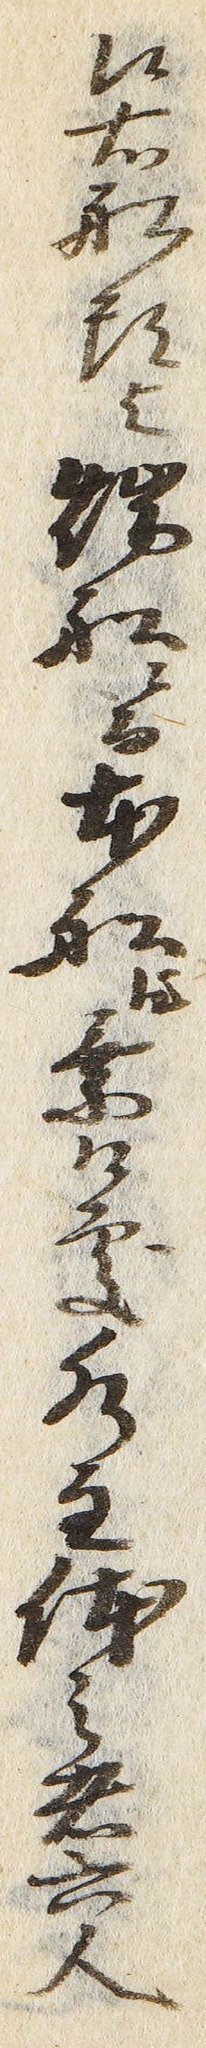候右舩頭と端舩ニ而本舩江乗候處水主体之者六人
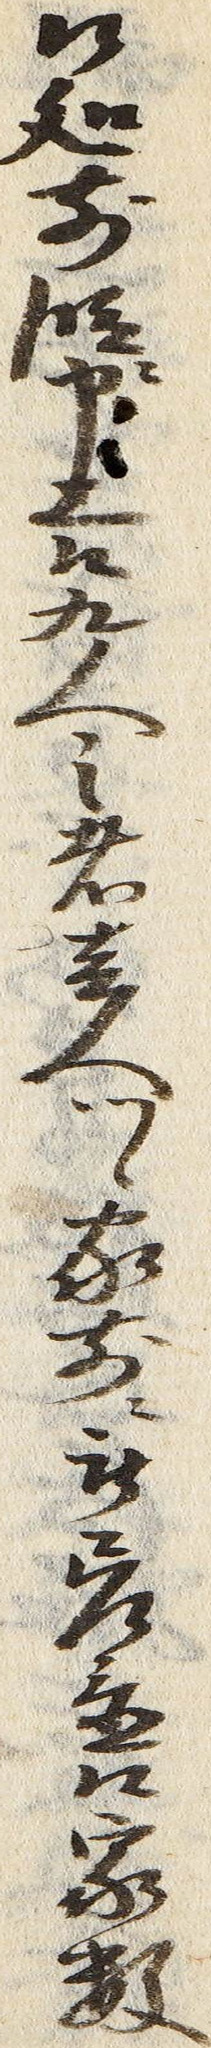候処前段ニ申上候九人之者壱人ツヽ家前ニ被差置候家数
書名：漂流人善助聞書
